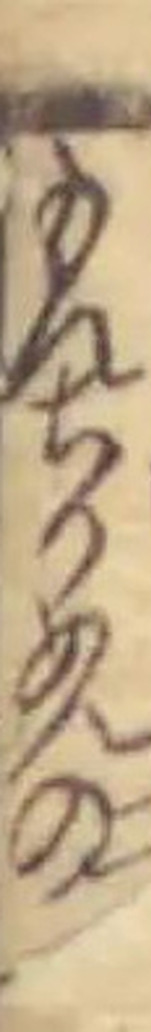もんちりめんの
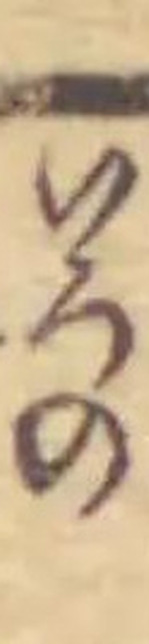いろの
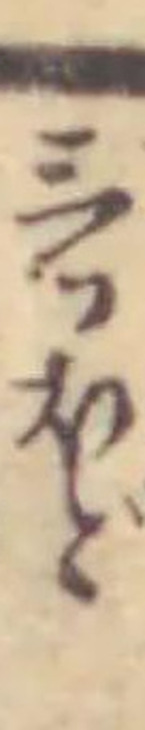三ツほど
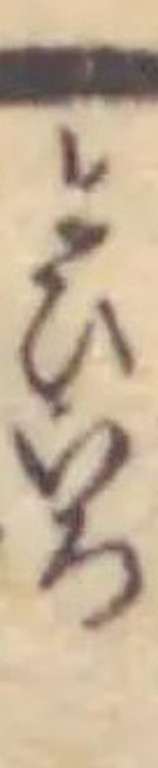とひいろ
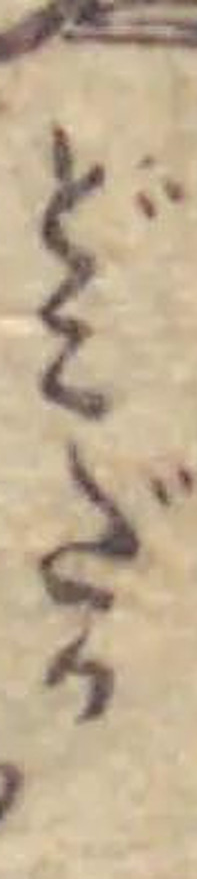どこだか
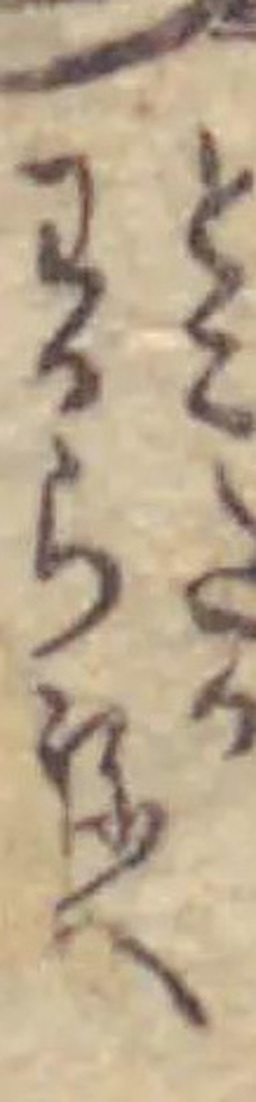わからねへ
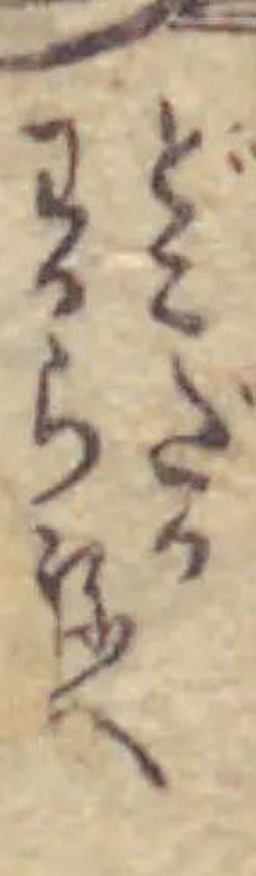わからねへ
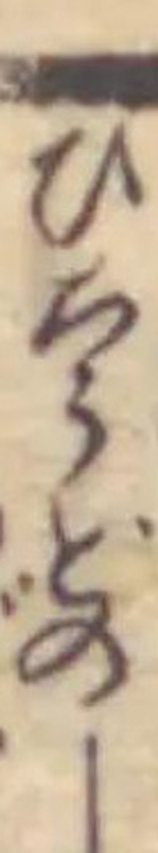ひろうどの
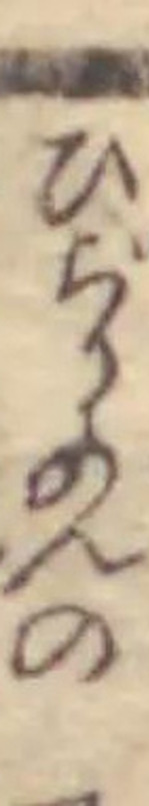ひぢりめんの
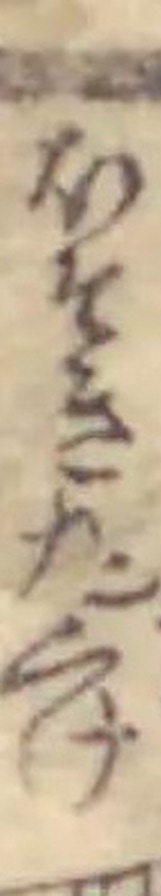ほそきくけ
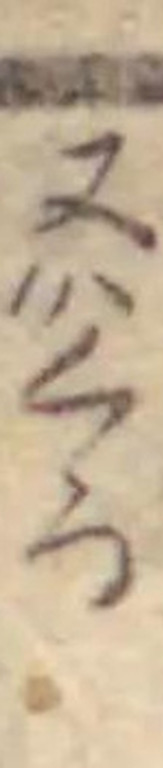又はくろ
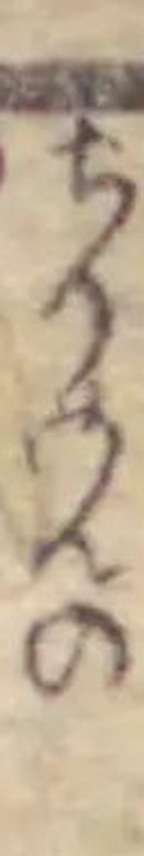ちりめんの
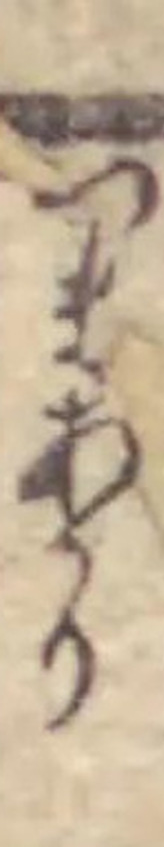つまあかり
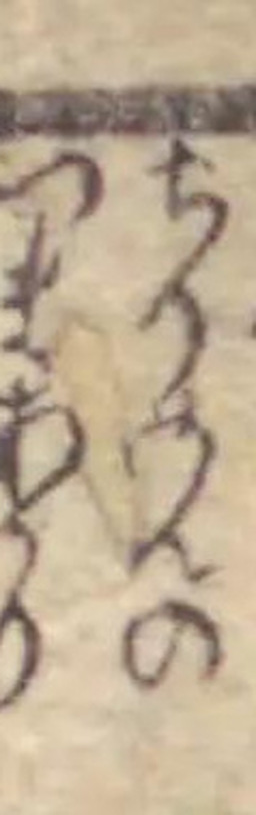つまあかり
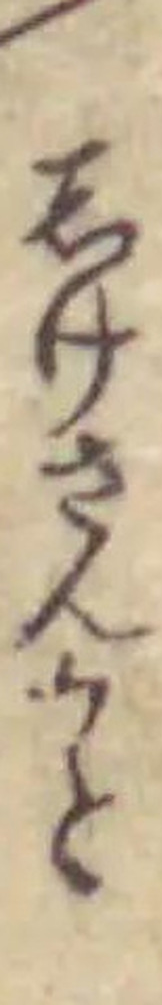しけさんかと
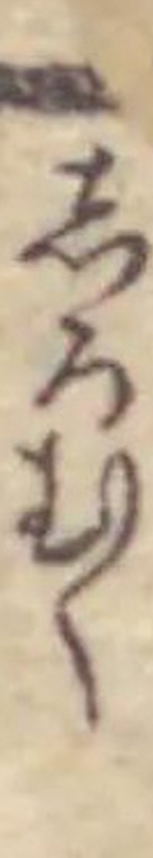しろむく
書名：家伝寿命薬 2巻
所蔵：国立国会図書館 National Diet Library, JAPAN
